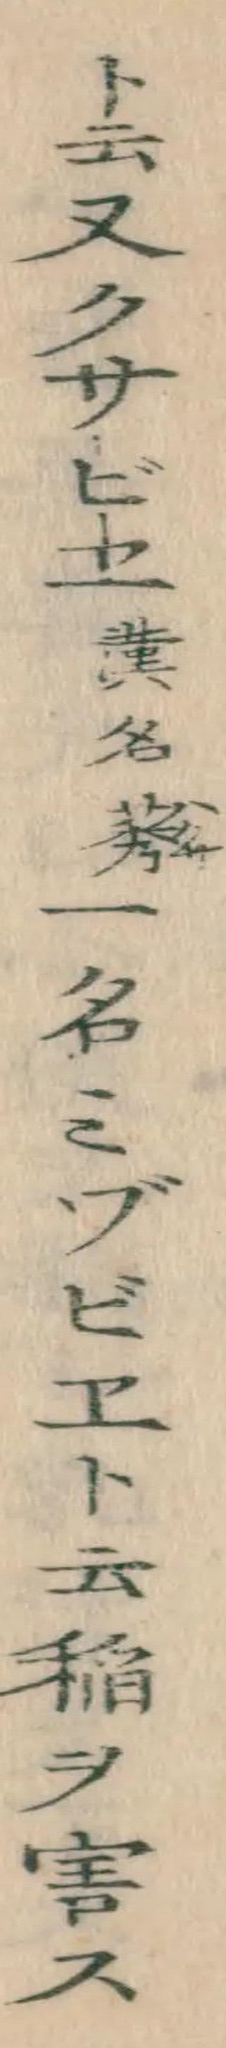ト云又クサ-ビ-ヱ漢名莠一名ミヅビヱト云稲ヲ害ス
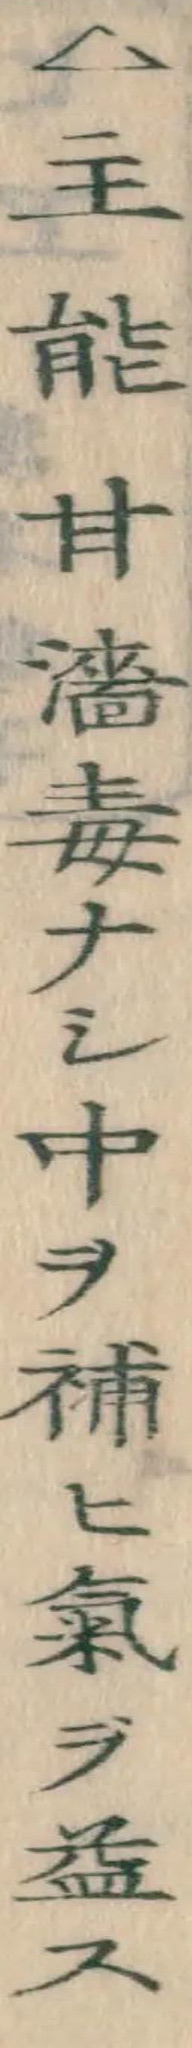△主能甘濇毒ナシ中ヲ補ヒ気ヲ益ス
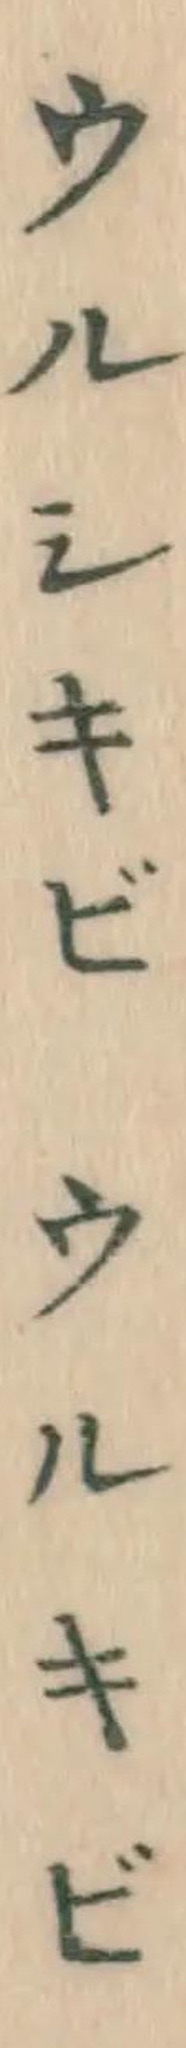ウルシキビウルキビ

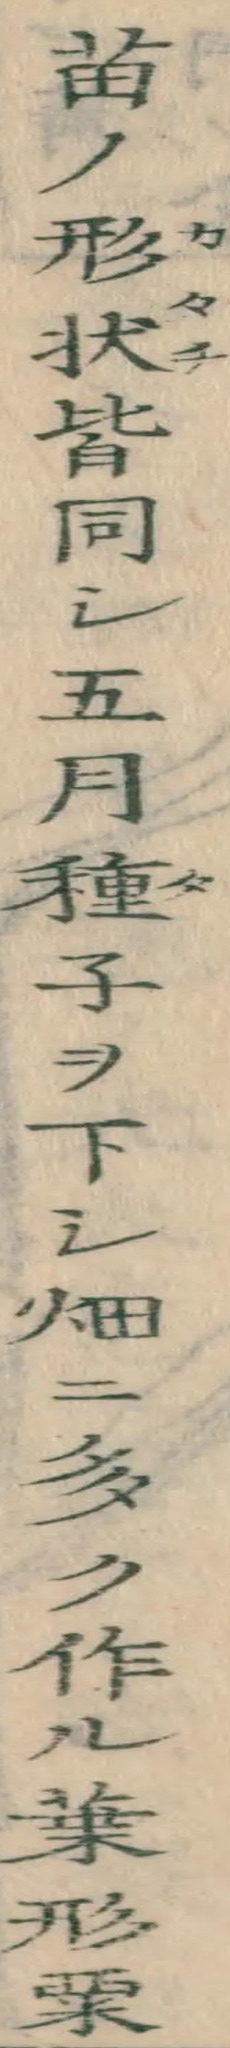苗ノ形状皆同シ五月種ネヲ下シ畑ニ多ク作ル葉形粟
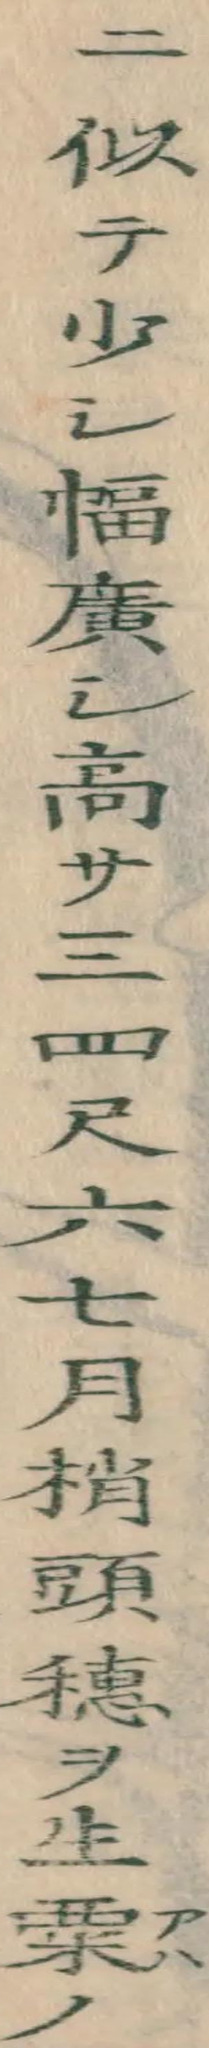ニ似テ少シ幅広シ高サ三四尺六七月梢頭穂ヲ生粟ノ
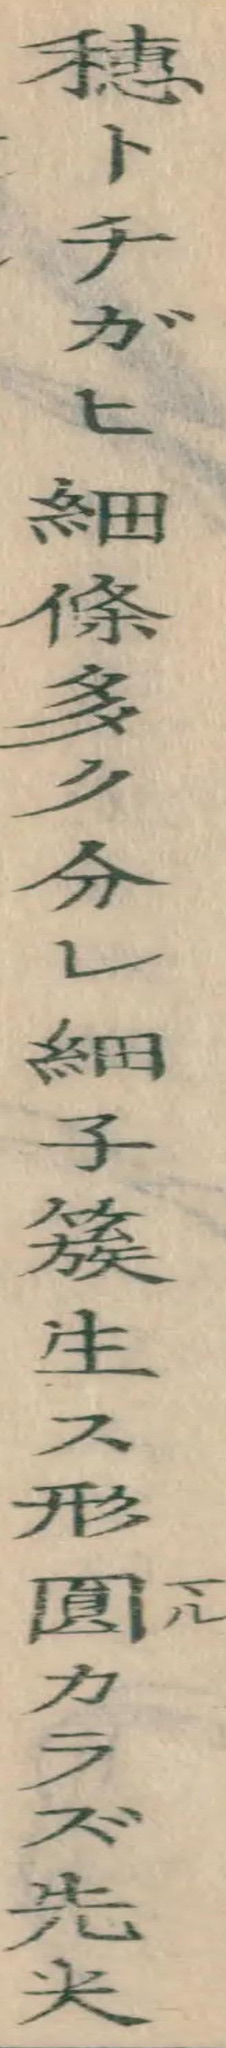穂トチガヒ細条多ク分レ細子簇生ス形円カラズ先尖
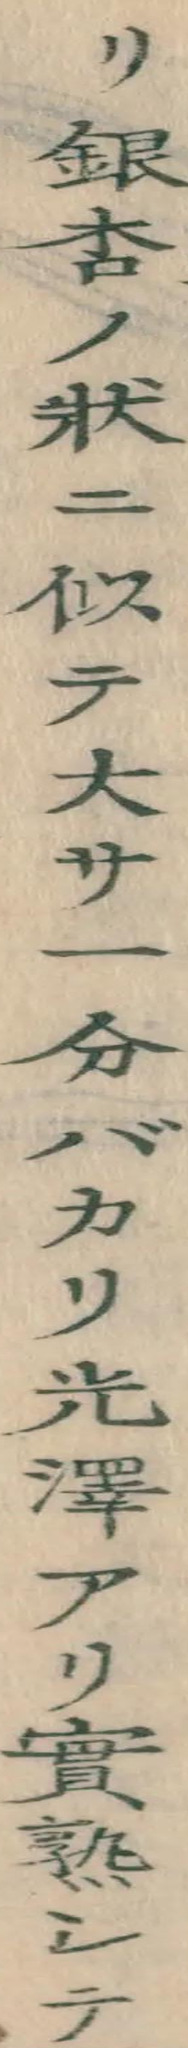リ銀杏ノ状ニ似テ大サ一分バカリ光沢アリ実熟シテ
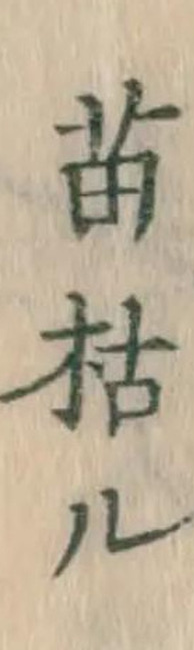苗枯ル
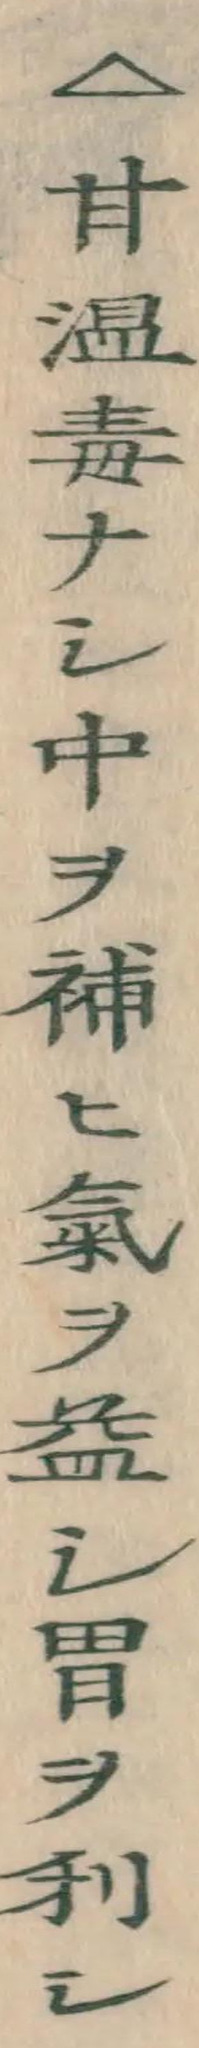△甘温毒ナシ中ヲ補ヒ気ヲ益シ胃ヲ利シ
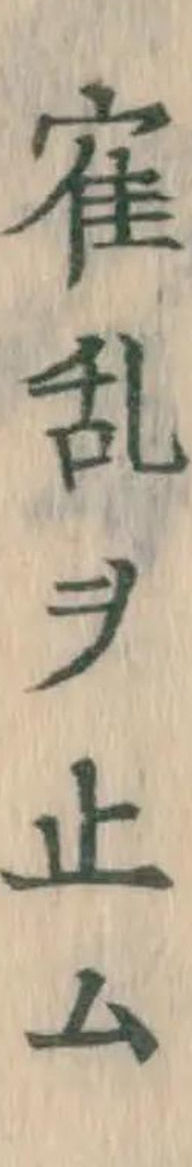寉乱ヲ止ム

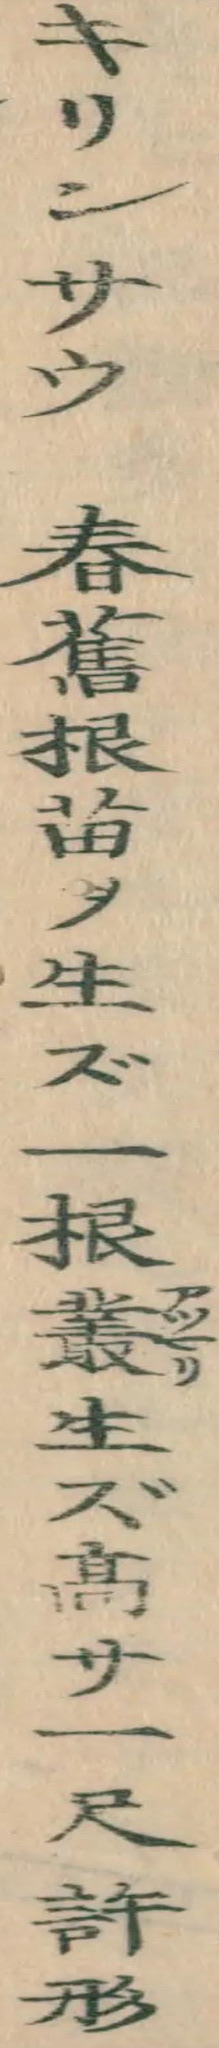キリンサウ春旧根苗ヲ生ズ一根叢生ズ高サ一尺許形
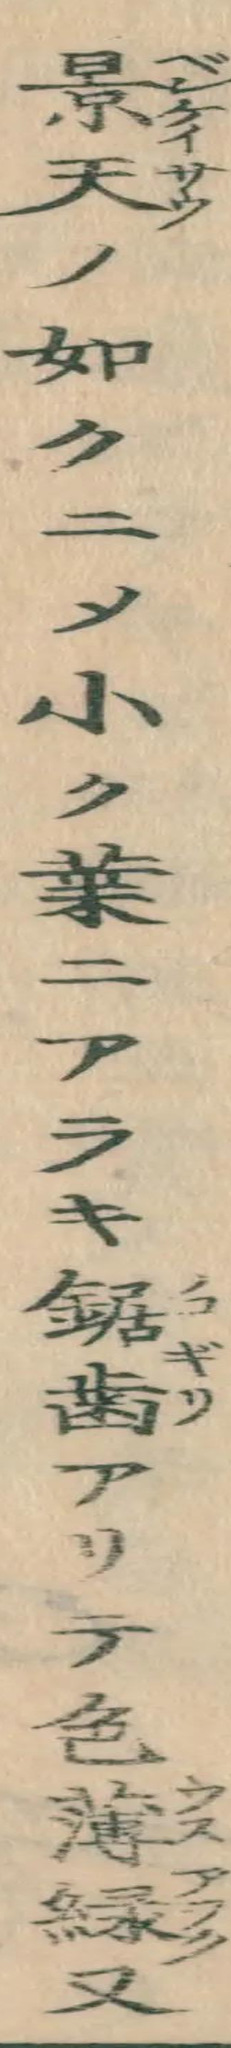景天ノ如クニシテ小ク葉ニアラキ鋸歯アリテ色薄緑又
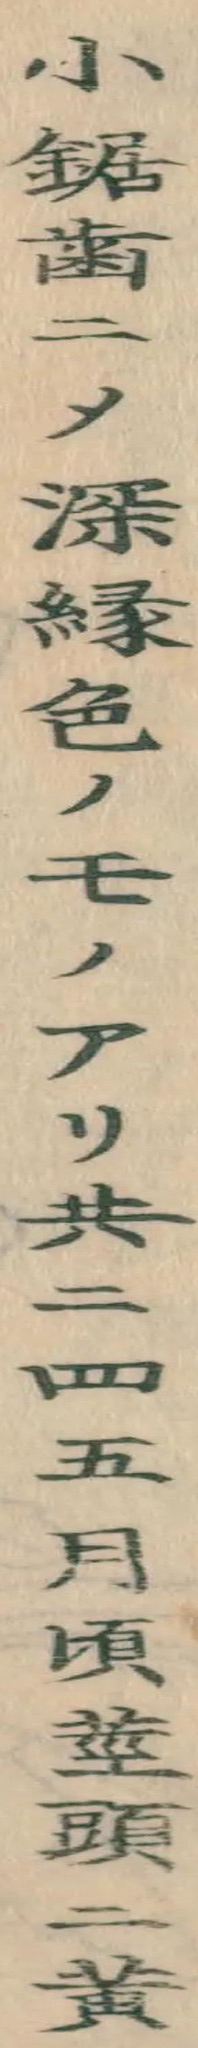小鋸歯ニシテ深縁色ノモノアリ共ニ四五月頃茎頭ニ黄
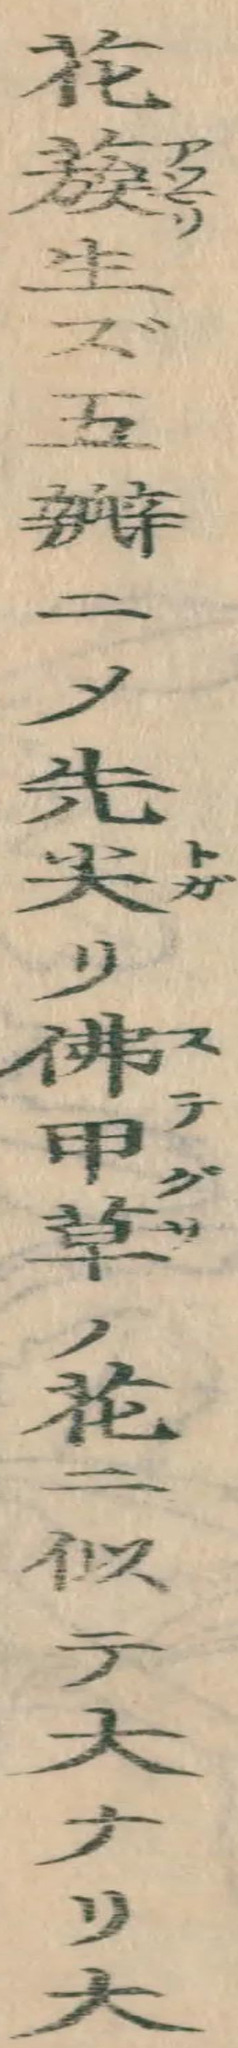花簇生ズ五弁ニシテ先尖リ仏甲草ノ花ニ似テ大ナリ大
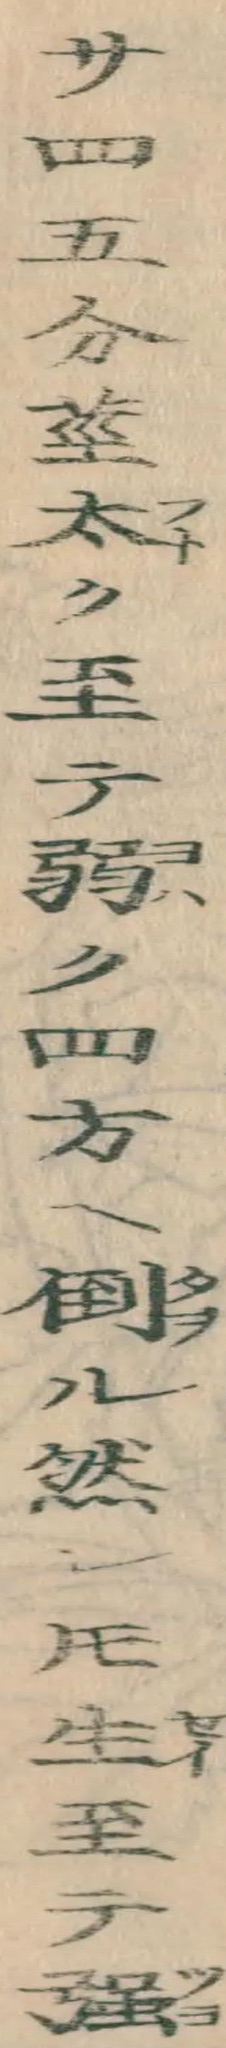サ四五分茎太ク至テ弱ク四方ヘ倒ル然レトモ生至テ強
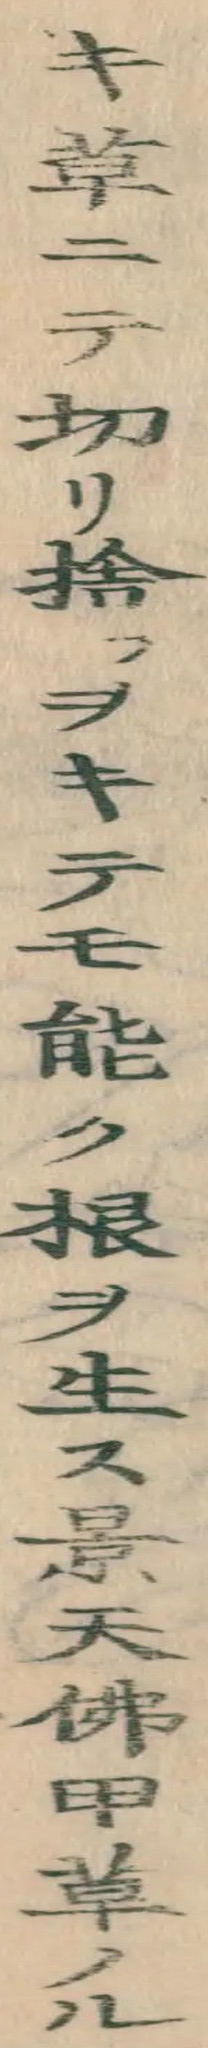キ草ニテ切リ捨能ク根ヲ生ス景天仏甲草ノル
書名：これこれ草 2巻. [2]
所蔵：国立国会図書館 National Diet Library, JAPAN
